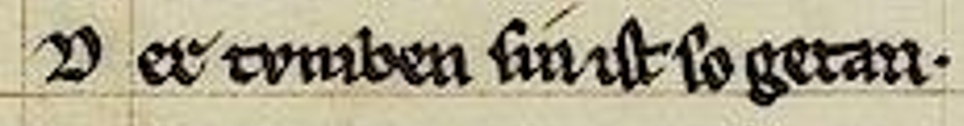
Der tvmben ſin iſt ſo getan.
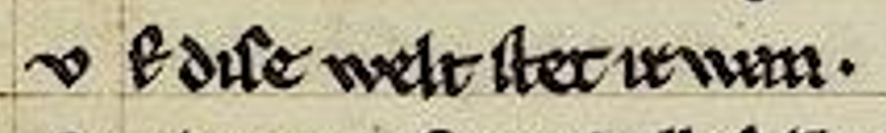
Vf diſe welt ſtet ir wan.
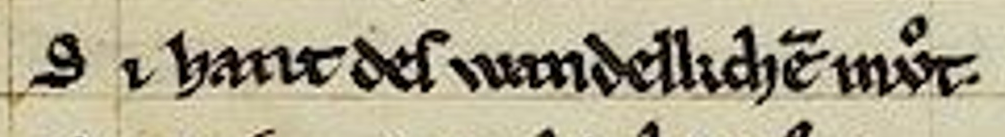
Si hant deſ wandelliche(n) mv°ot.
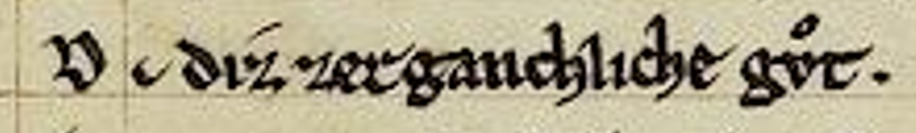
D(az) diz zerganchliche gv°ot.
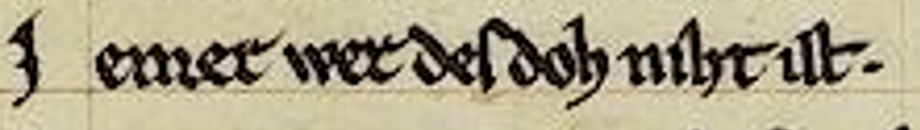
Iemer wer deſ doh niht iſt.
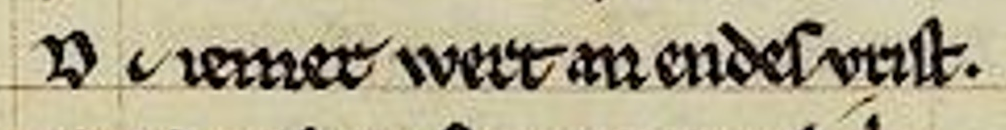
D(az) iemer wert an endeſ vriſt.
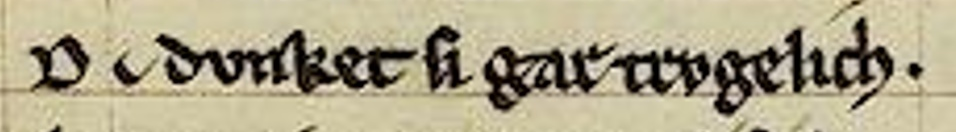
D(az) dvnket ſi gar trvgelich.
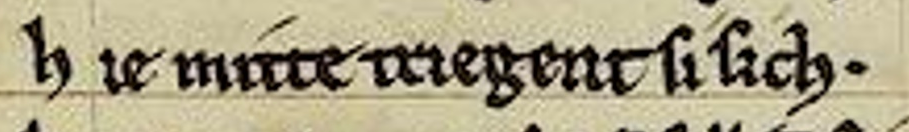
Hie mitte triegent ſi ſich.
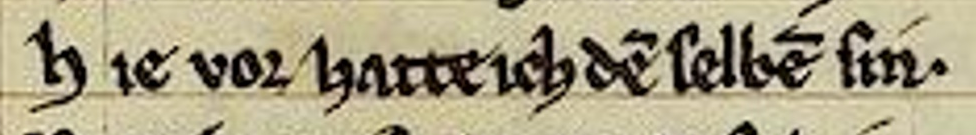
Hie vor hatte ich de(n) ſelbe(n) ſin.
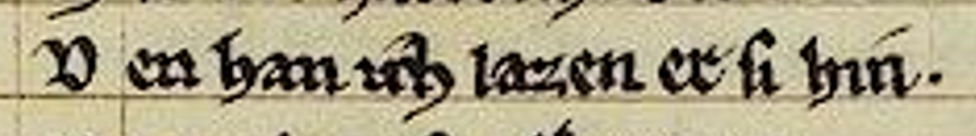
Den han ich lazen er ſi hin.
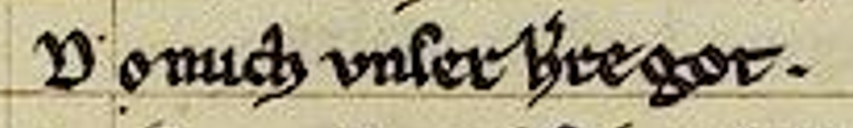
Do mich vnſer h(er)re got.
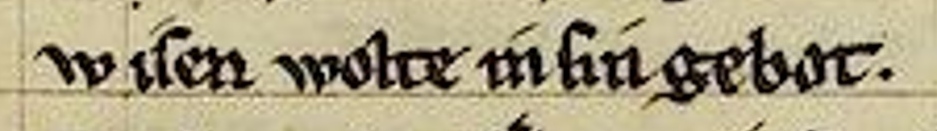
Wiſen wolte in ſin gebot.
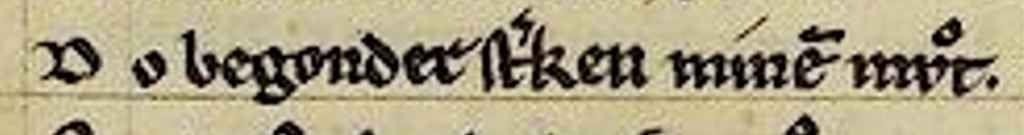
Do begonder ſt(er)ken mine(n) mv°ot.
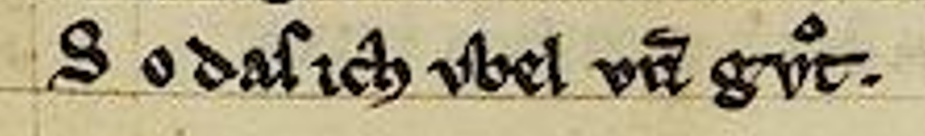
So daſ ich vbel vn(d) gv°ot.
